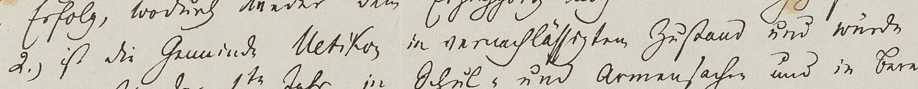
2.) ist die Gemeinde Uetikon in vernachlässigtem Zustand und würde
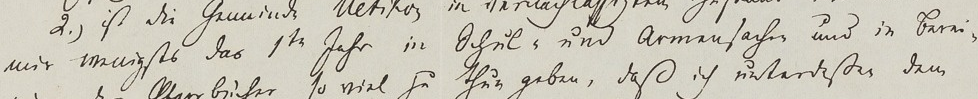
mir wenigsts das 1te Jahr in Schul- und Armensachen und in Berei-
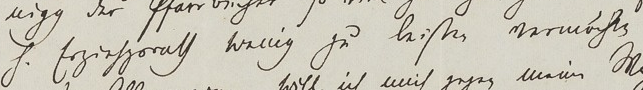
h. Erziehungsrath wenig zu leisten vermöchte.
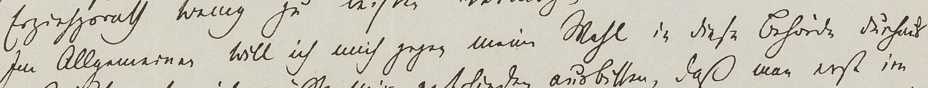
Im Allgemeinen will ich mich gegen meine Wahl in diese Behörde durchaus
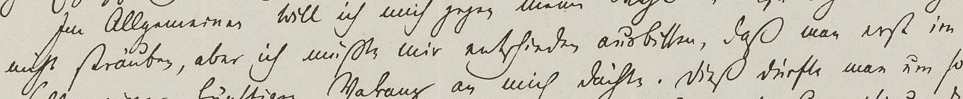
nicht sträuben, aber ich müßte mir entschieden ausbitten, daß man erst im
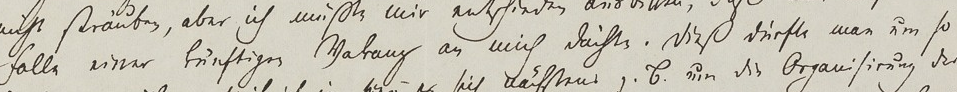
Falle einer künftigen Vakanz an mich dächte. Dieß dürfte man um so
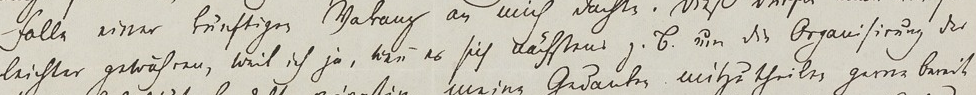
leichter gewähren, weil ich ja, wenn es sich nächstens z. B. um die Organisirung der
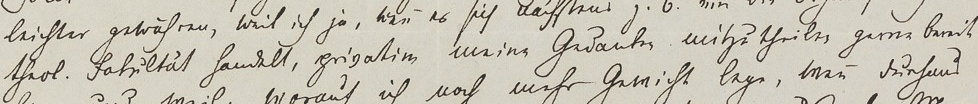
theol. Fakultät handelt, privatim meine Gedanken mitzutheilen gerne bereit
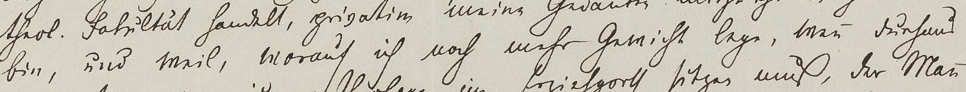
bin, und weil, worauf ich noch mehr Gewicht lege, wenn durchaus
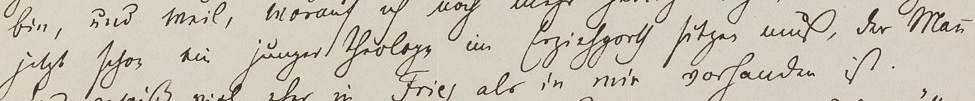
jetzt schon ein junger Theologe im Erhiehgsrth sitzen muß, der Mann
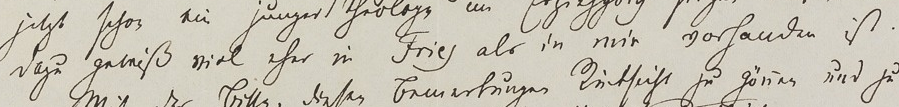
dazu gewiß viel eher in Fries als in mir vorhanden ist.
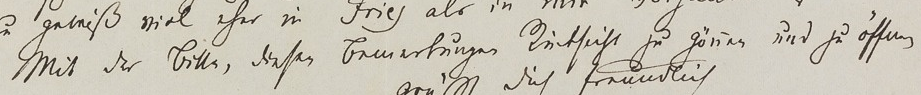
Mit der Bitte, diesen Bemerkungen Rücksicht zu gönnen und zu öffnen,
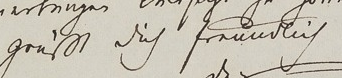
Grüßt Dich freundlich
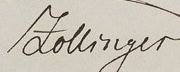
Zollinger
